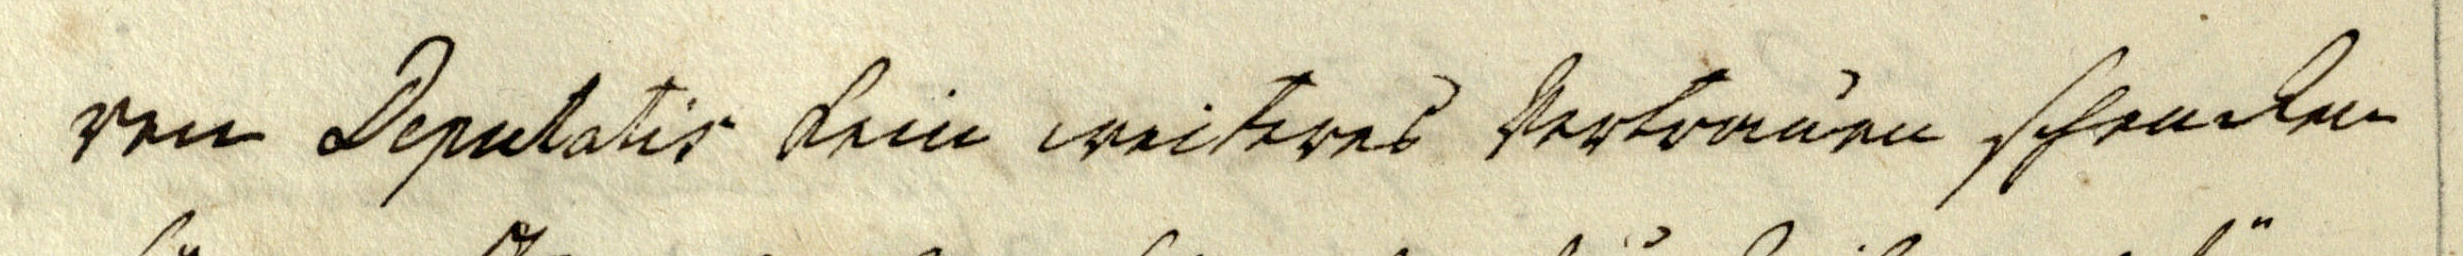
ren Deputatis kein weiteres Vertrauen schencken
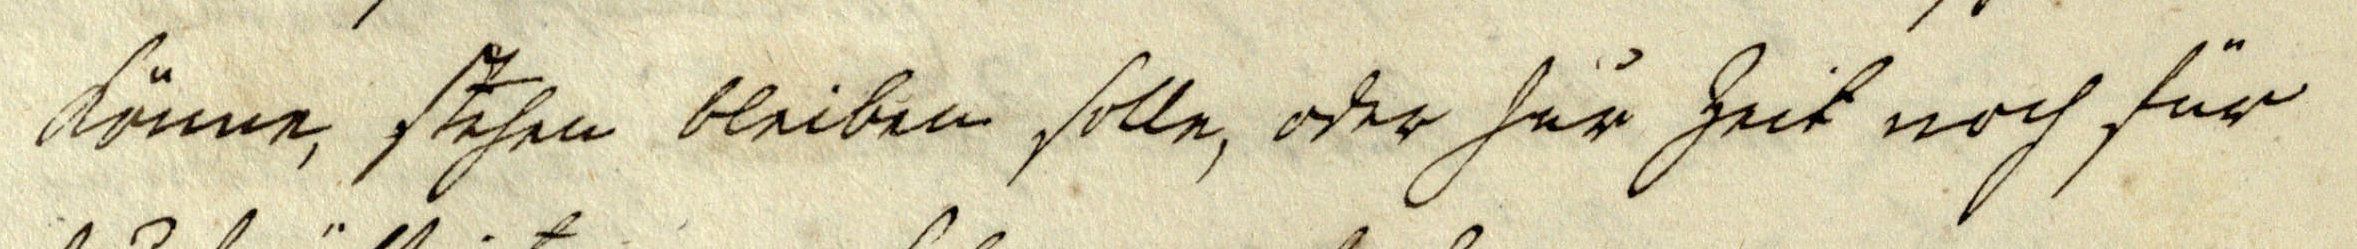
könne, stehen bleiben solle, oder zur Zeit noch für
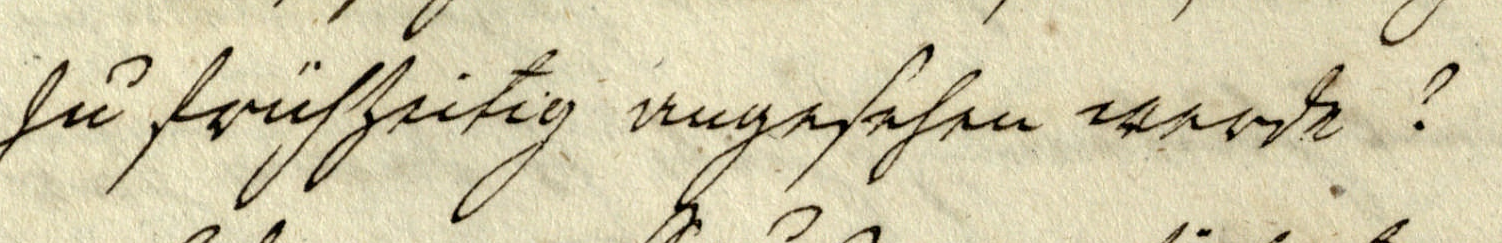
zu frühzeitig angesehen werde?
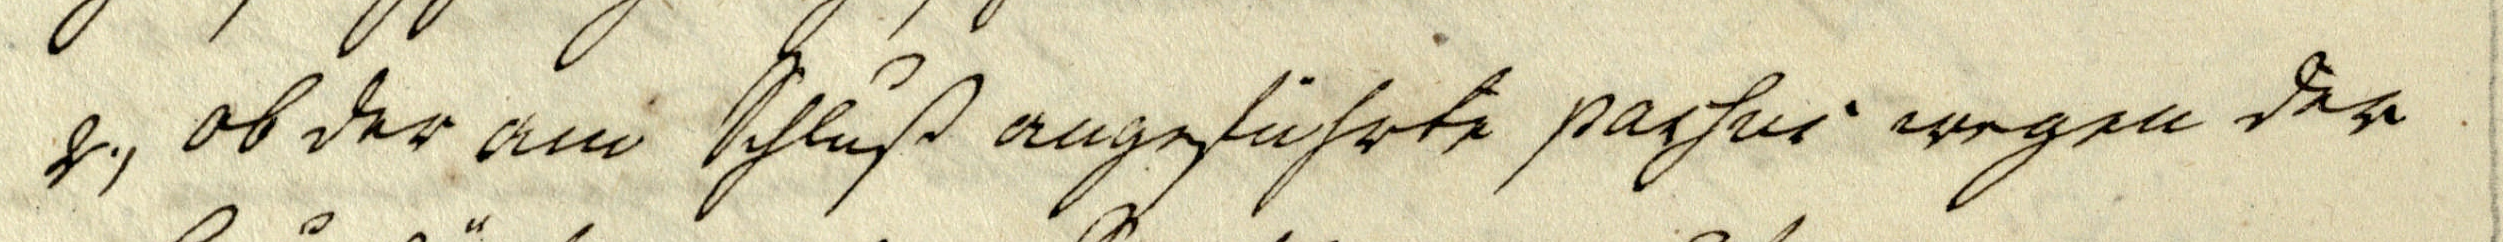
2, ob der am Schluß angeführte passus wegen der
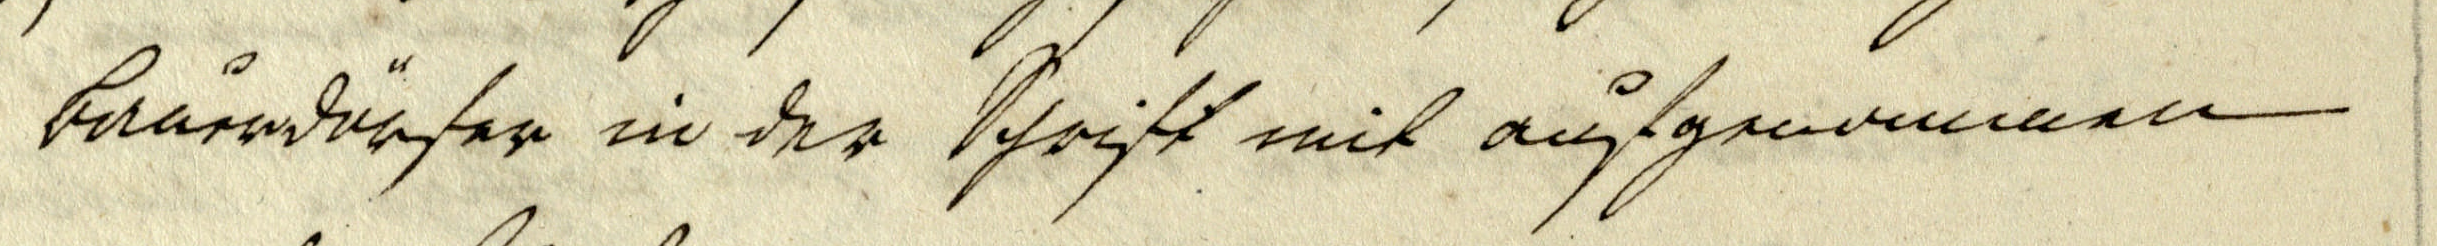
Bauerdörfer in der Schrift mit aufgenommen
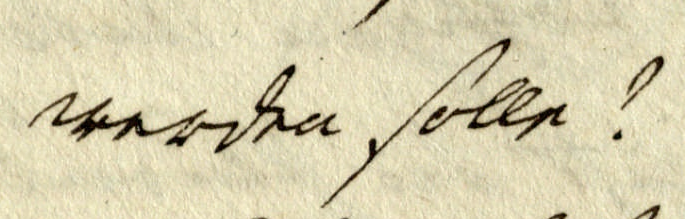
werden solle?
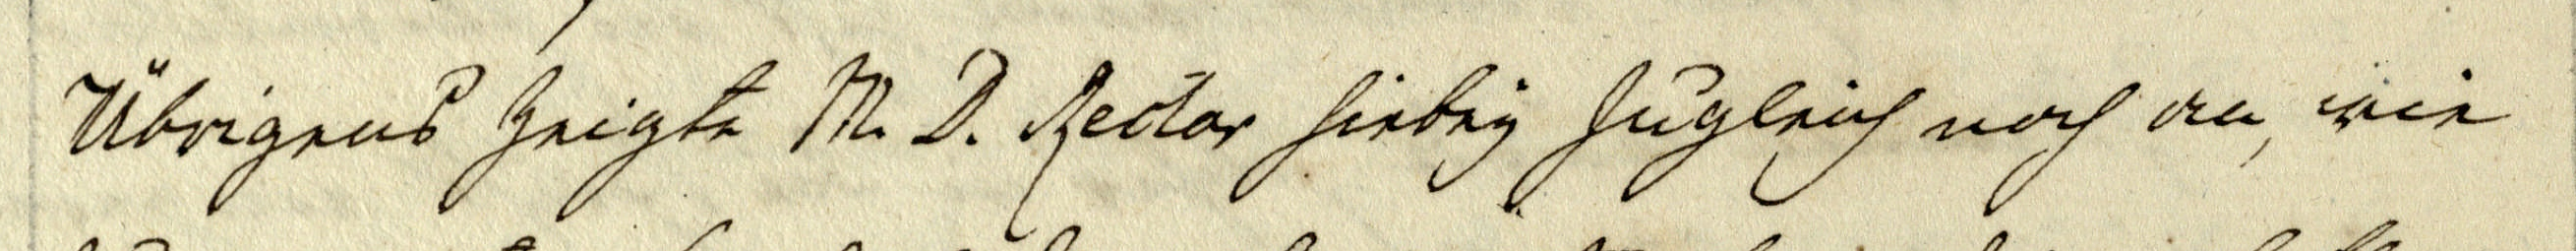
Übrigens zeigte M. D. Rector hiebei zugleich noch an, wie
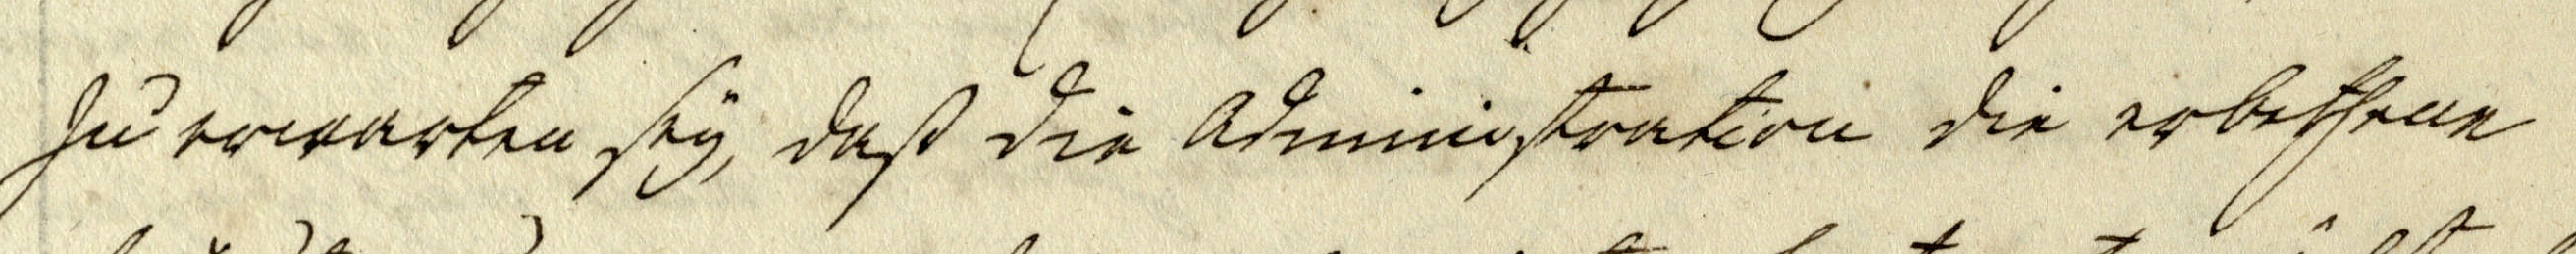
zu erwarten seÿ, daß die Administration die erbethene
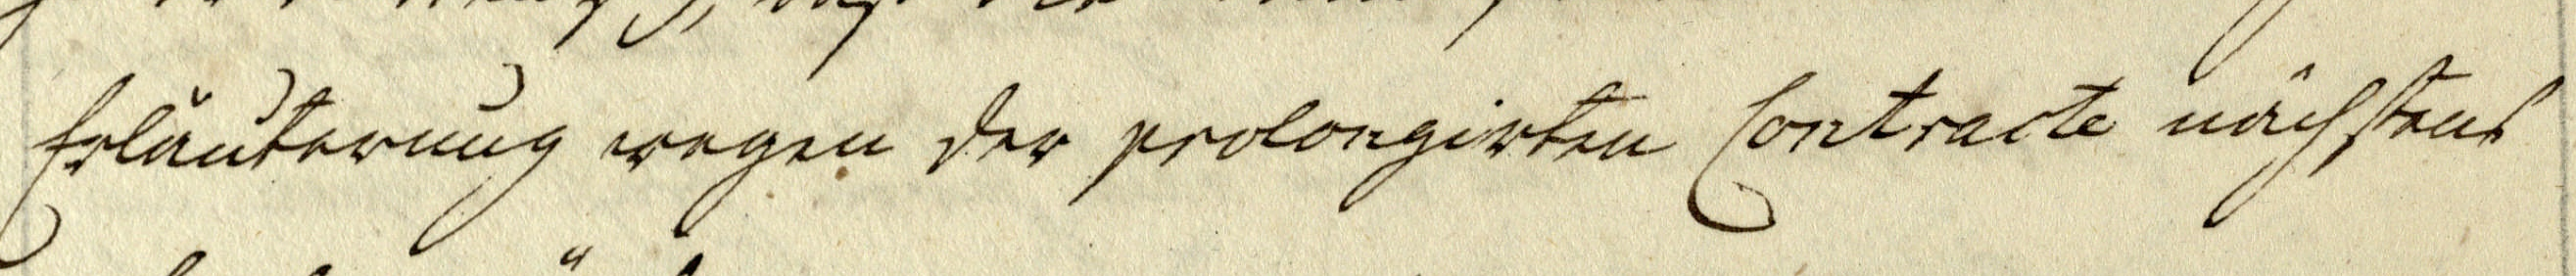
Erläuterung wegen der prolongirten Contracte nächstens
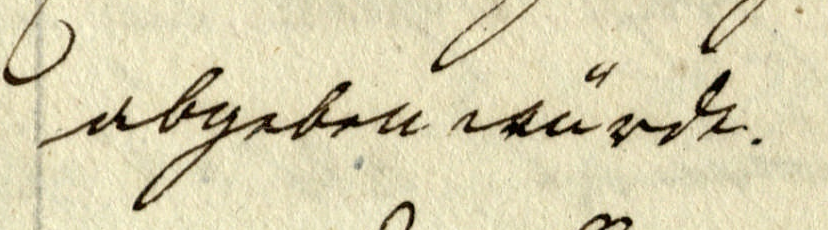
abgeben würde.
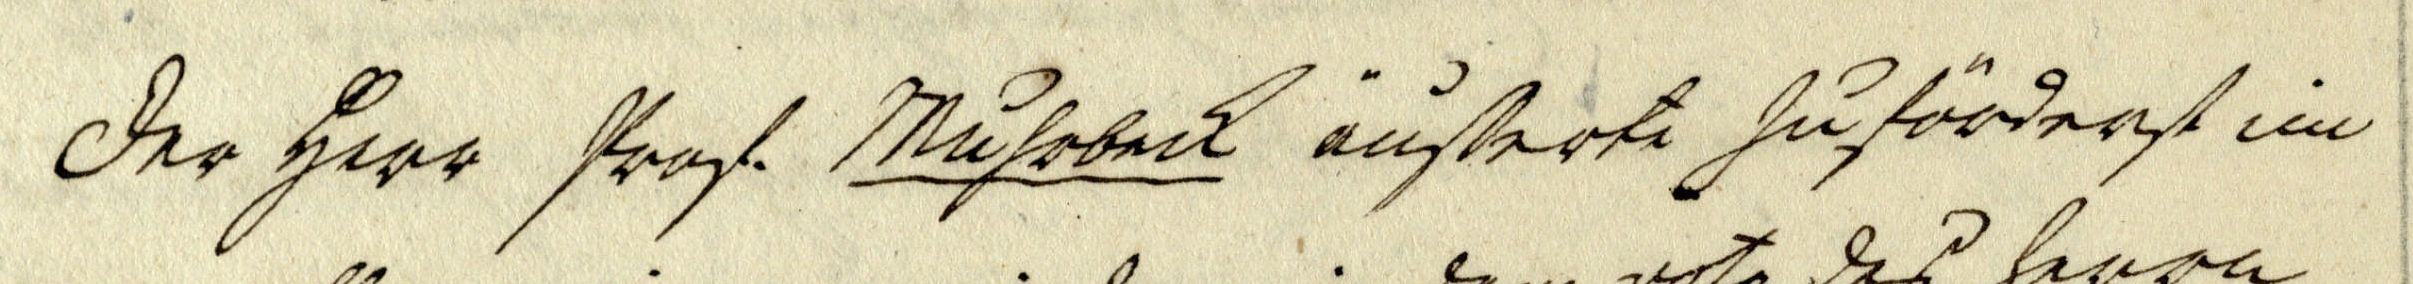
Der Herr Prof. Muhrbeck äusserte zuförderst im
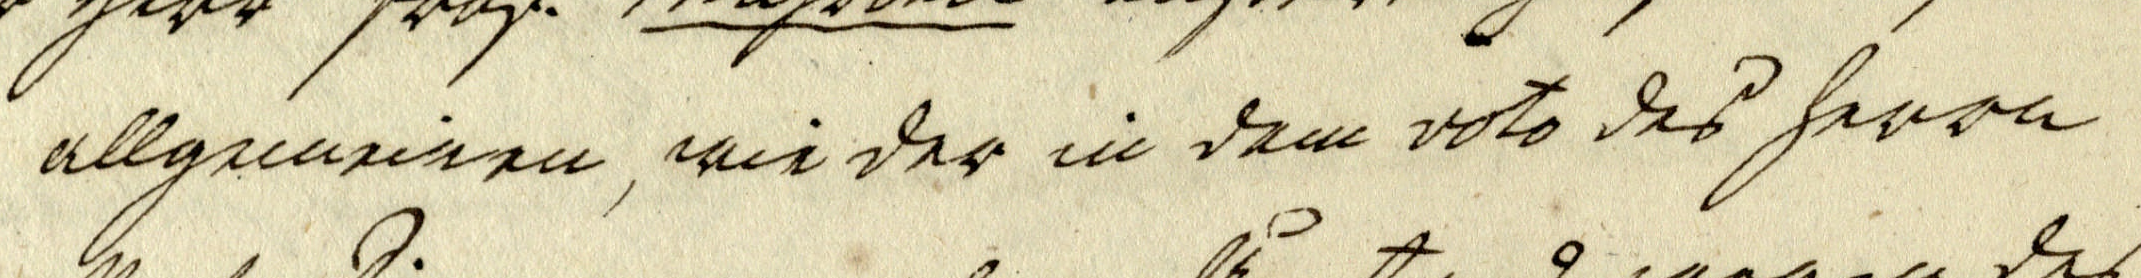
allgemeinen, wie der in dem voto des Herrn
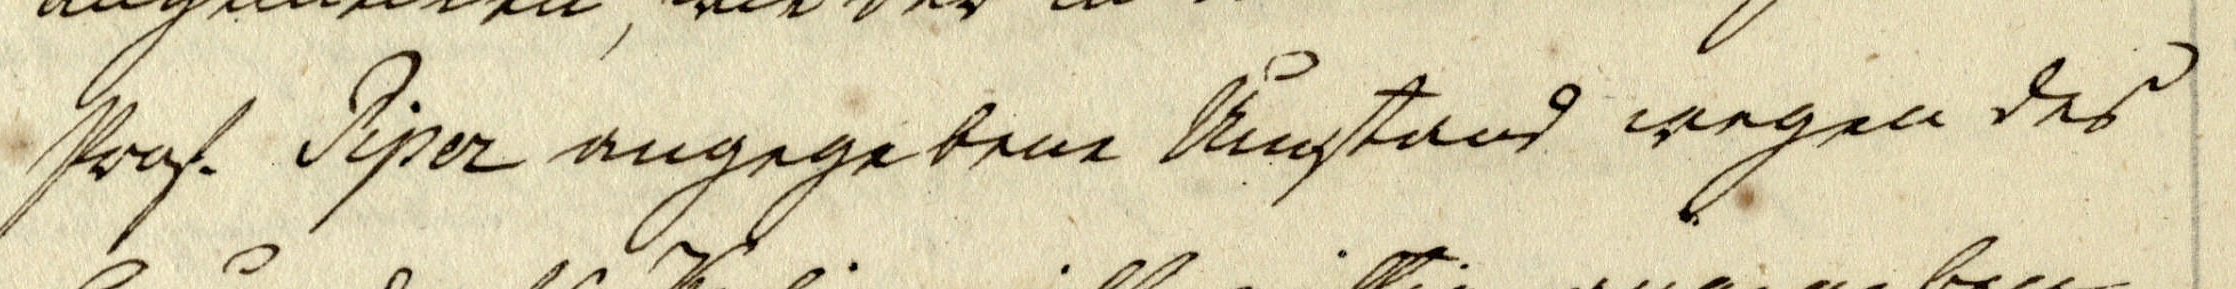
Prof. Piper angegebene Umstand wegen des
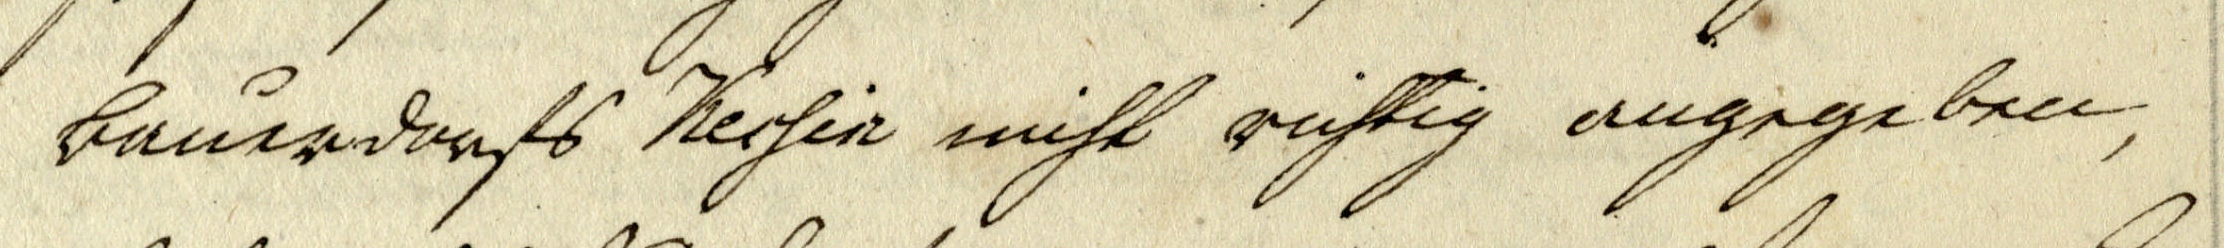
Bauerdorfs Kessin nicht richtig angegeben,
